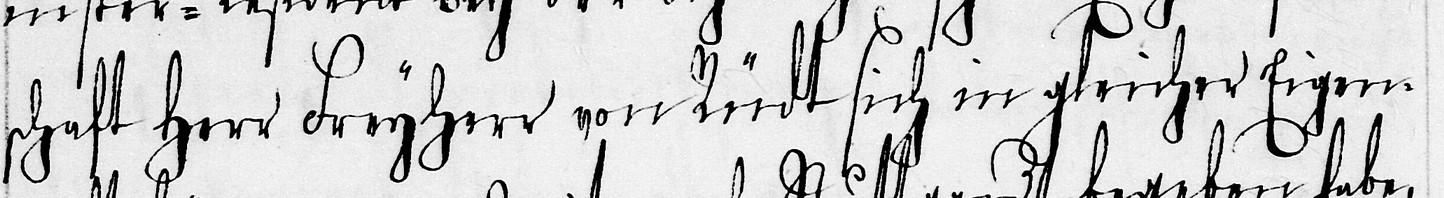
chaft Herr Freyherr von Rüdt sich in gleicher Eigen¬
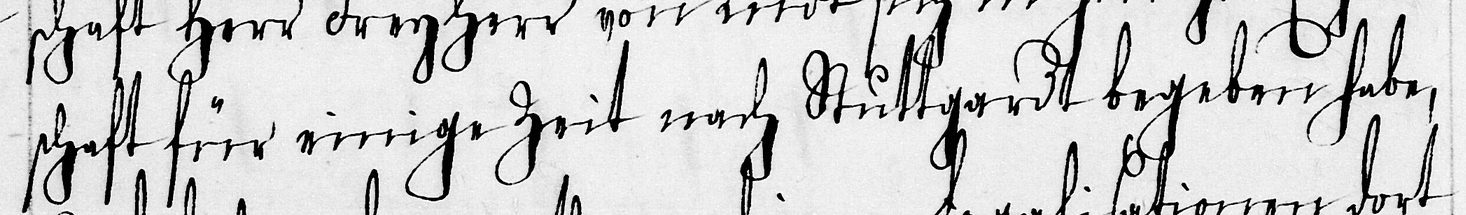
schaft für einige Zeit nach Stuttgardt begeben habe,
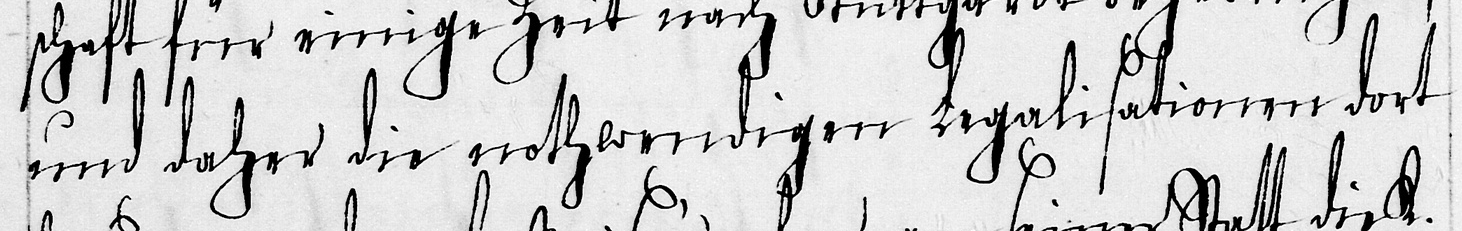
und daher die nothwendigen Legalisationen dort
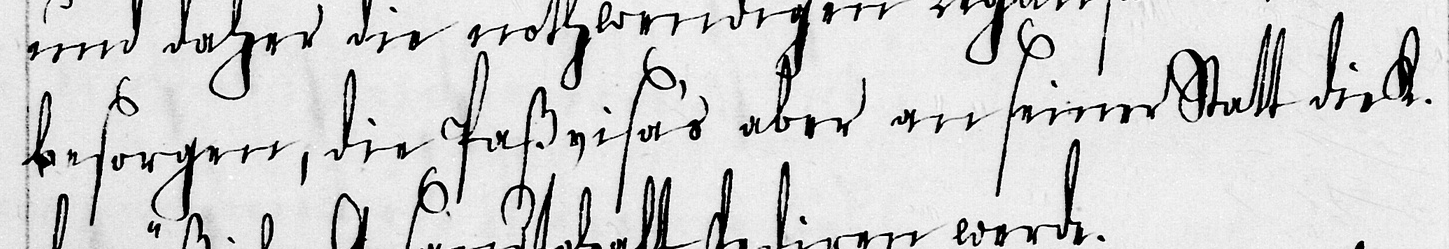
besorgen, die Paßvisa’s aber an seiner Statt die K.
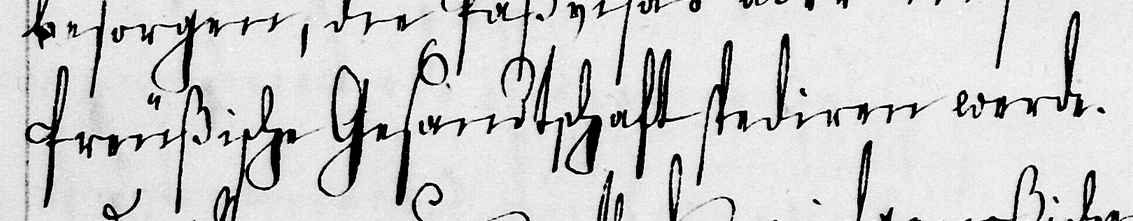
Preußische Gesandtschaft spediren werde.
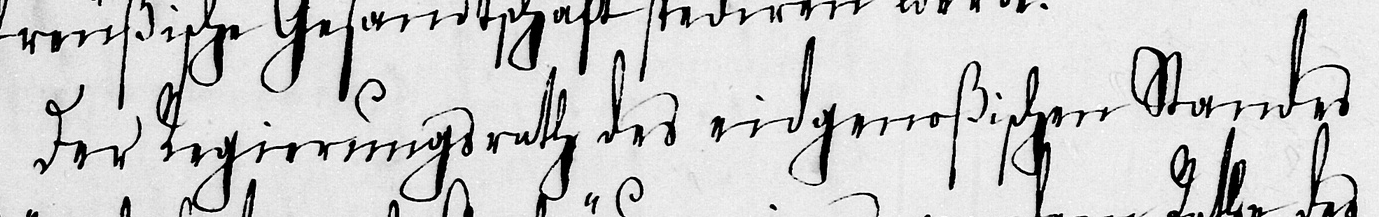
Der Regierungsrath des eidgenoßischen Standes
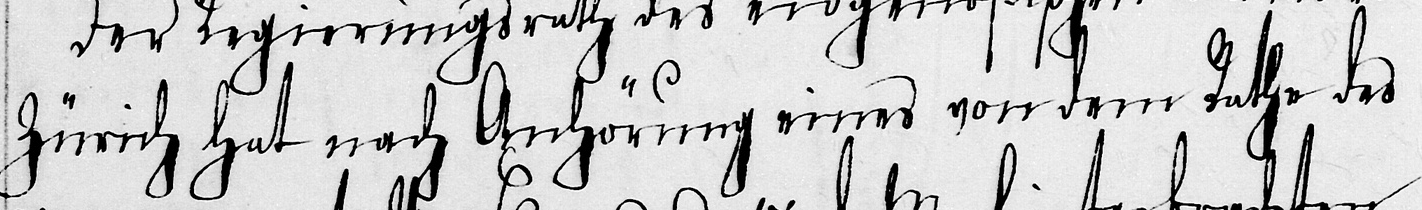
Zürich hat nach Anhörung eines von dem Rathe des
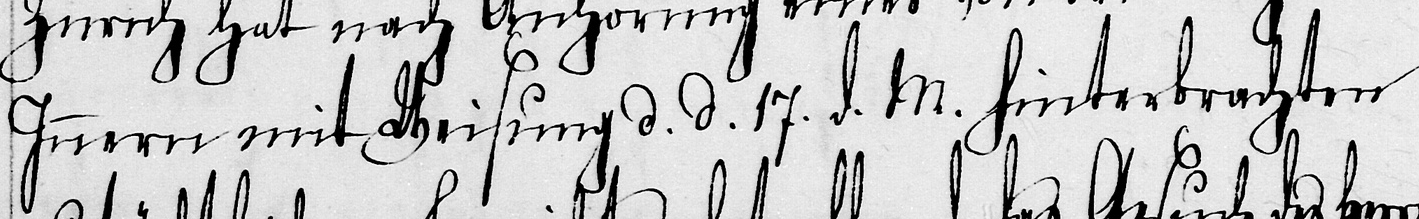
Innern mit Weisung d. d. 17. d. M. hinterbrachten
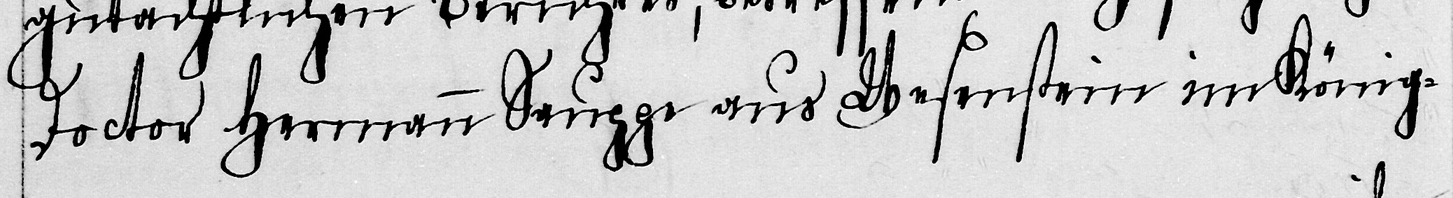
Doctor Hermann Sauppe aus Wesenstein im König-
